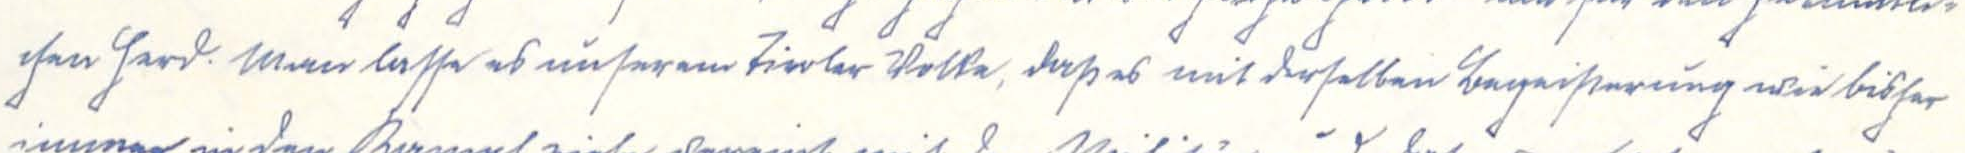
chen Herd. Man lasse es unserem Tiroler Volke, daß es mit derselben Begeisterung wie bisher
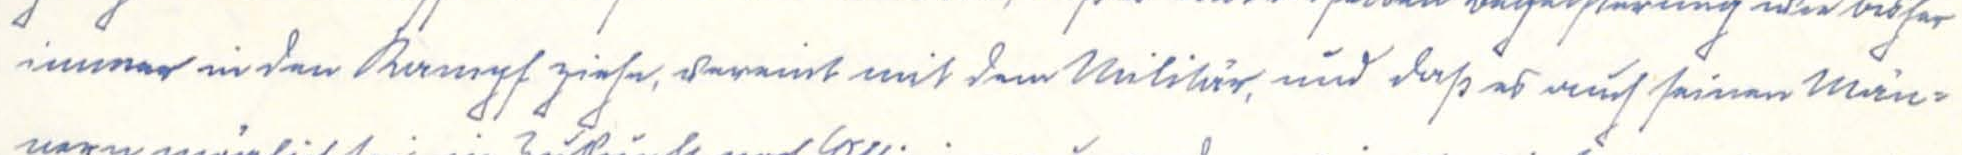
immer in den Kampf ziehe, vereint mit dem Militär und daß es auch seinen Män-
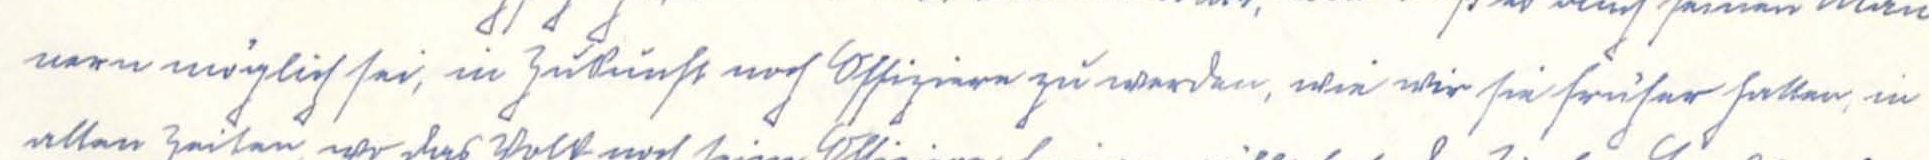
nern möglich sei, in Zukunft noch Offiziere zu werden, wie wir sie früher hatten, in
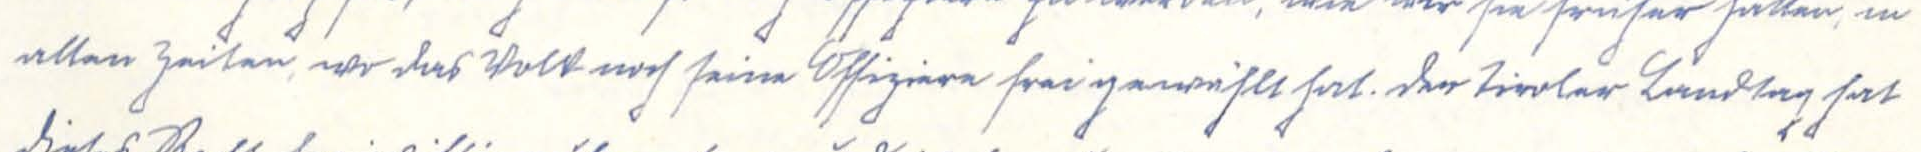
alten Zeiten, wo das Volk noch seine Offiziere frei gewählt hat. Der Tiroler Landtag hat
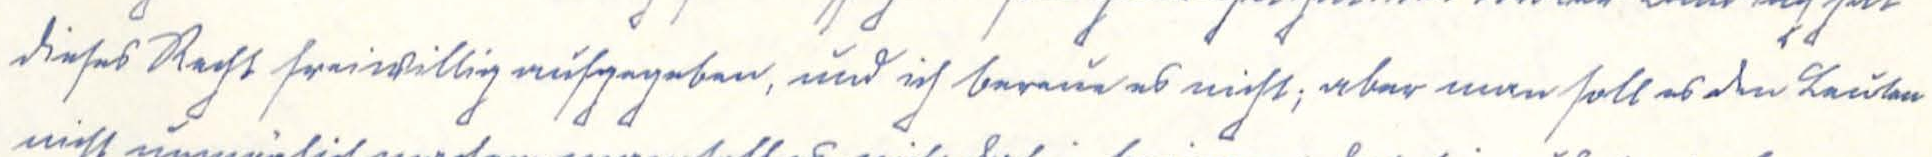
dieses Recht freiwillig aufgegeben, und ich bereue es nicht; aber man soll es den Leuten
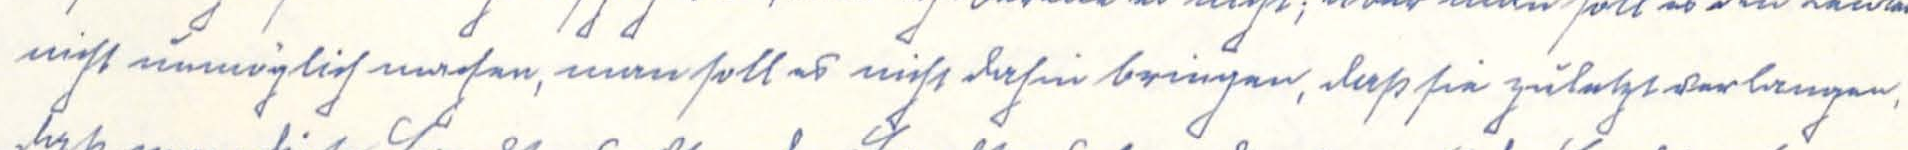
nicht unmöglich machen, man soll es nicht dahin bringen, daß sie zuletzt verlangen,
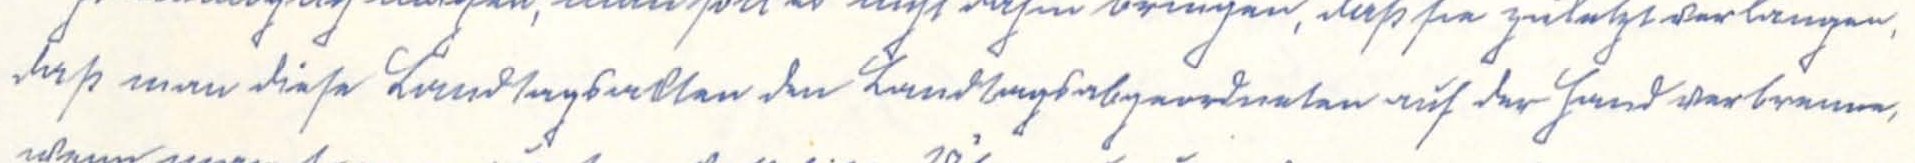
daß man diese Landtagsakten den Landbagsabgeordneten auf der Hand verbrenne,
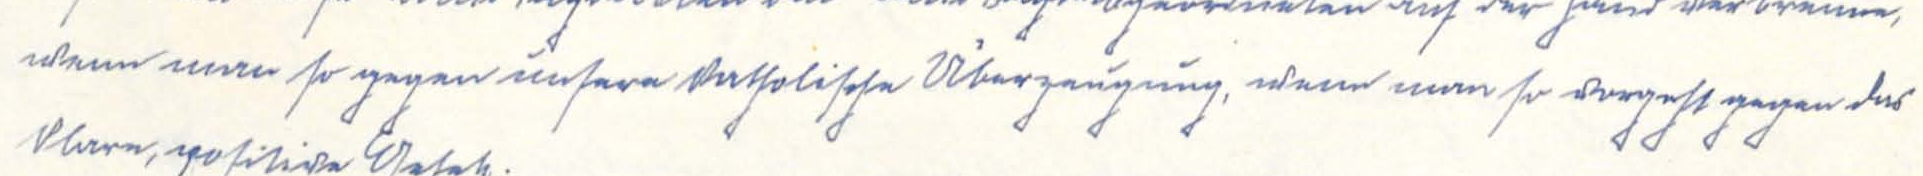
wenn man so gegen unsere katholische Überzeugung, wenn man so vergeht gegen das
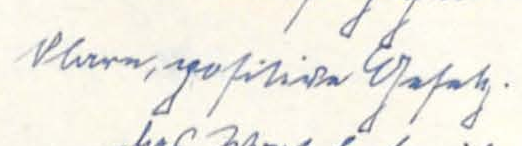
klare positive Gesetz.
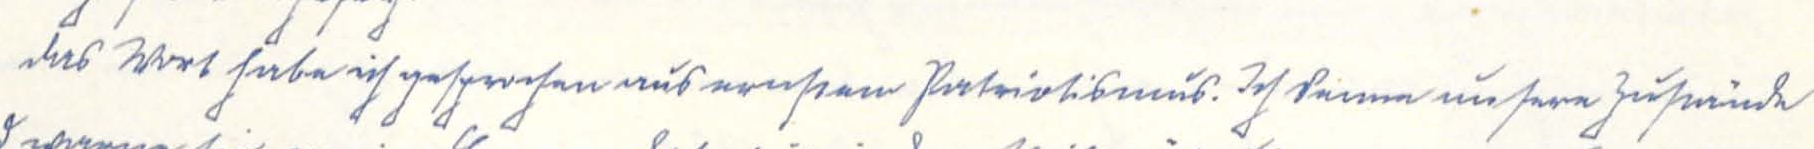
Das Wort habe ich gesprochen aus ernstem Patriotismus. Ich kenne unsere Zustände
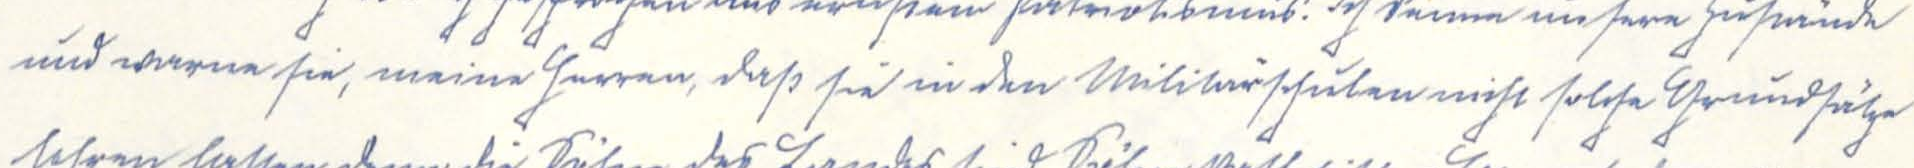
und warne sie, meine Herren, daß sie in den Militärschulen nicht solche Grundsätze
